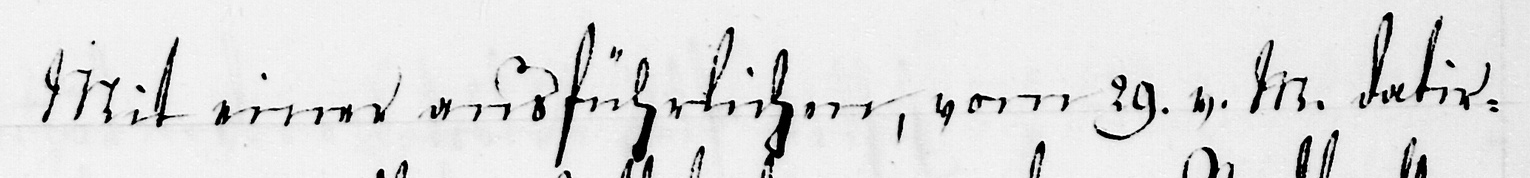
Mit einer ausführlichen, vom 29. v. M. datir¬
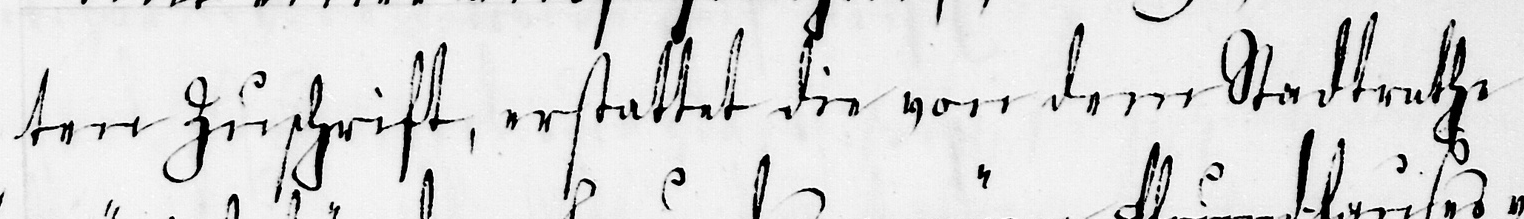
ten Zuschrift, erstattet die von dem Stadtrathe
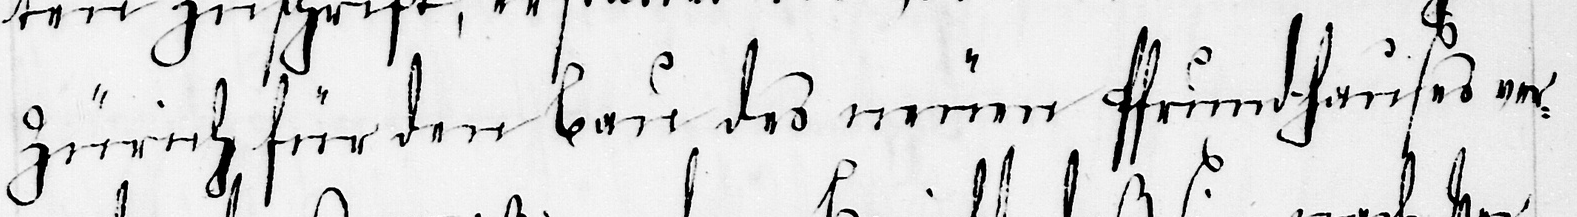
Zürich für den Bau des neuen Pfrundhauses ver¬
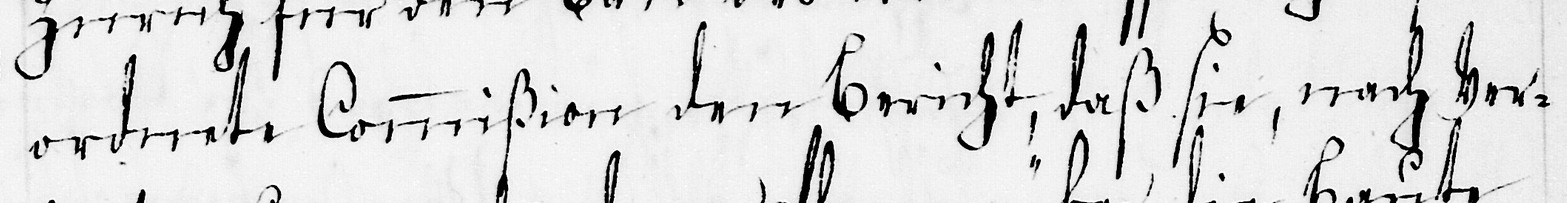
ordnete Commißion den Bericht, daß sie, nach Ver¬
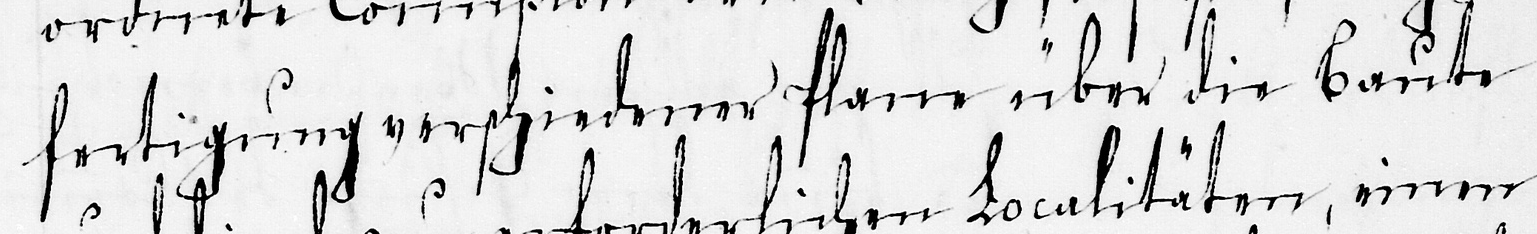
fertigung verschiedener Plane über die Baute
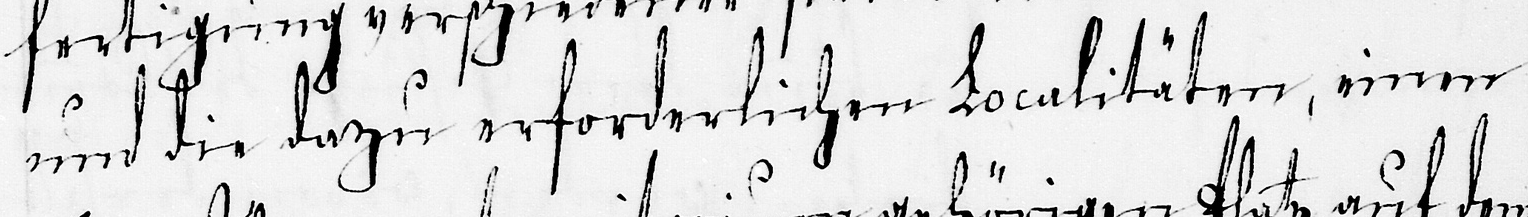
und die dazu erforderlichen Localitäten, einen
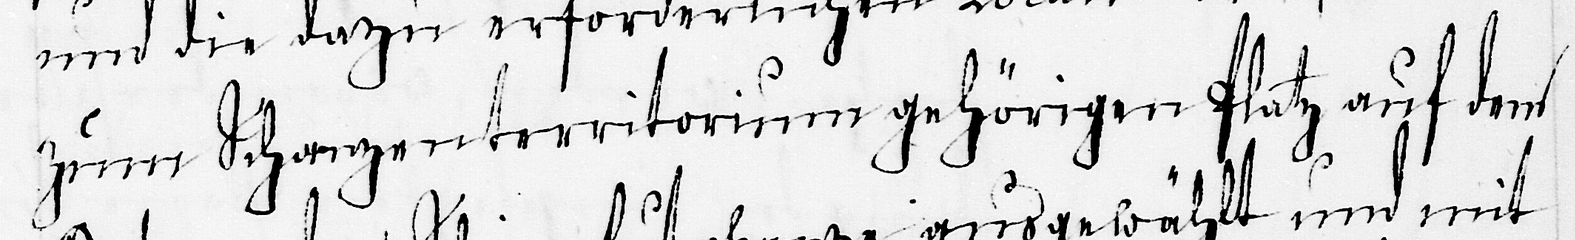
zum Schanzenterritorium gehörigen Platz auf dem
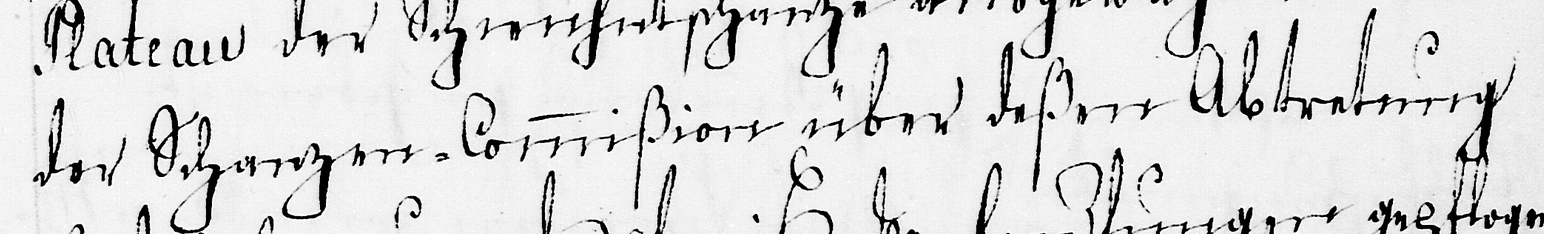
der Schanzen-Commißion über deßen Abtretung
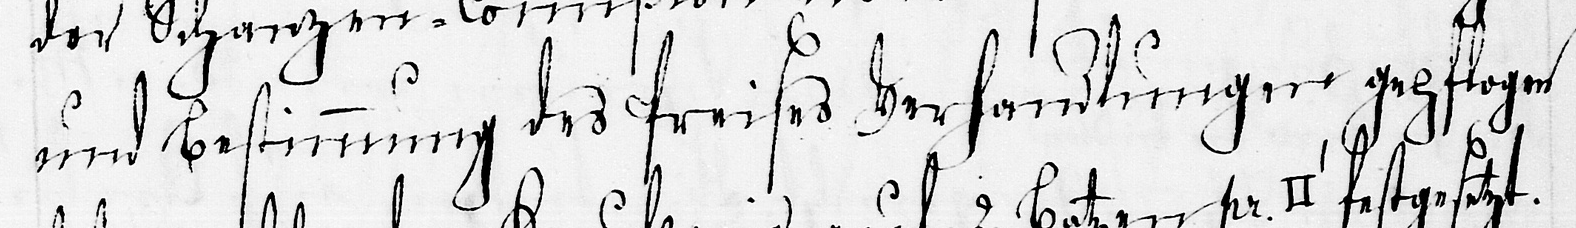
und Bestimmung des Preises Verhandlungen gepflogen
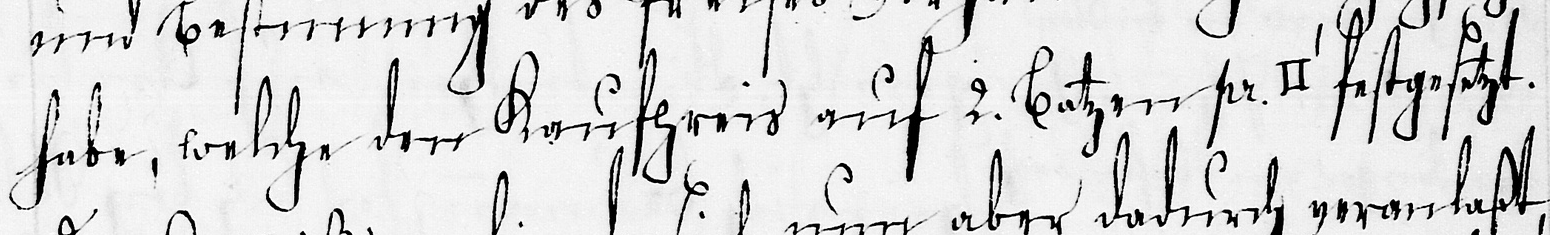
habe, welche den Kaufpreis auf 2. Batzen pr. [Quadrat¬
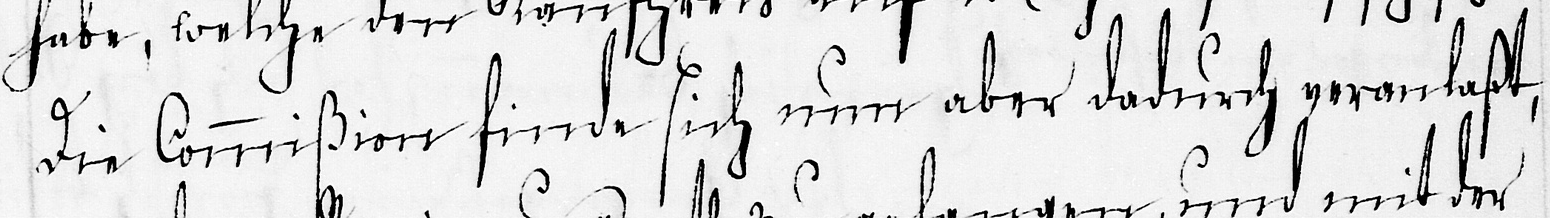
Die Commißion finde sich nun aber dadurch veranlaßt,
